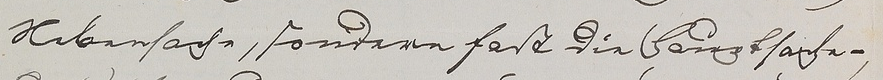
Nebensache, sondern fast die Hauptsache –
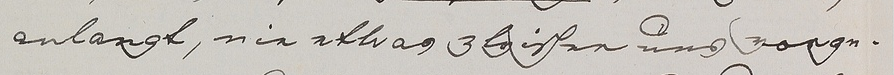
anlangt, nie etwas zwischen uns vorge-
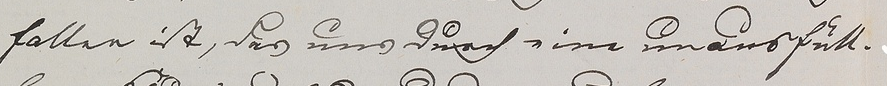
fallen ist, das uns durch eine unausfüll-
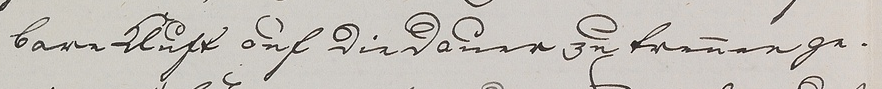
bare Kluft auf die Dauer zu trennen ge-
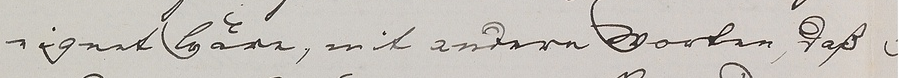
eignet wäre, mit andern Worten, daß
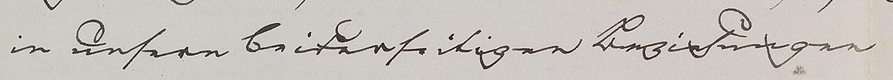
in unsern beiderseitigen Beziehungen
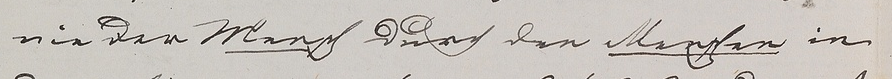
nie der Mensch durch den Menschen in
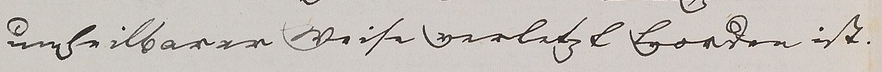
unheilbarer Weise verletzt worden ist.
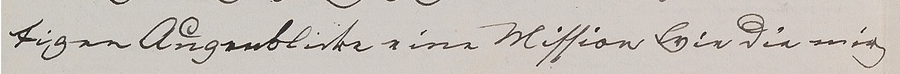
tigen Augenblicke eine Mission wie die mir
